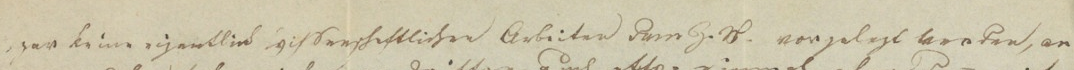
gar keine eigentlich wissenschaflichen Arbeiten dem Z.V. vorgelegt werden, an
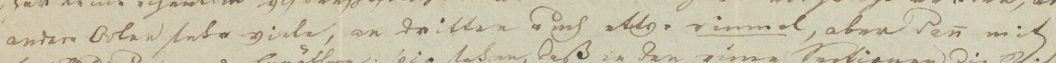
andern Orten sehr viele, an dritten auch etwa einmal, aber dann mit
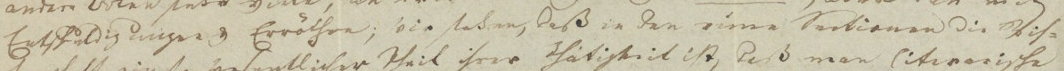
Entschuldigungen & Erröthen; wir sehen, daß in den einen Sectionen die Wis-
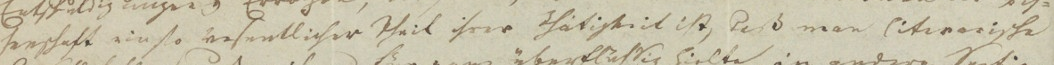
senschaft ein so wesentlicher Theil ihrer Thätigkeit ist, daß man literarische
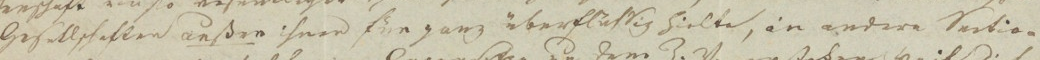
Gesellschaften außer ihnen für ganz überflüssig hielte, in anderen Sectio-
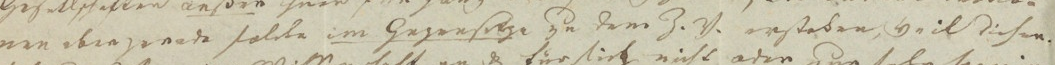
nen aber gerade solche im Gegensatze zu dem Z.V. erstehen, weil dieser
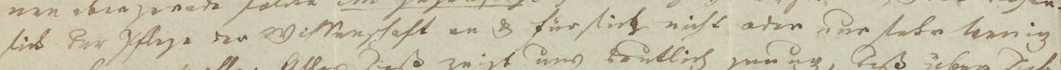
sich der Pflege der Wissenschaft an & für sich nicht oder nur sehr wenig
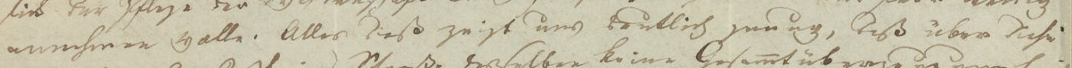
annehmen wolle. Alles dieß zeigt uns deutlich genug, daß über diese
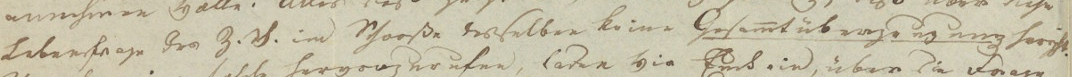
Lebensfrage des Z.V. im Schooße desselben keine Gesammtüberzeugung herrscht.
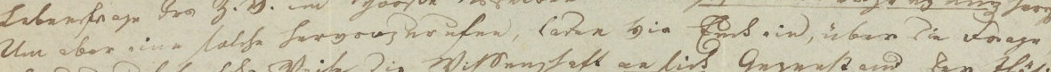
Um aber eine solche hervorzurufen, laden wir Euch ein, über die Frage,
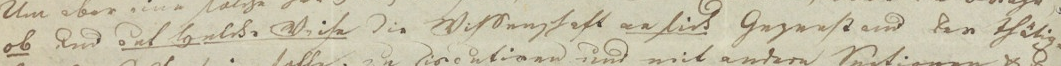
ob und auf welche Weise die Wissenschaft an sich Gegenstand der Thätig-
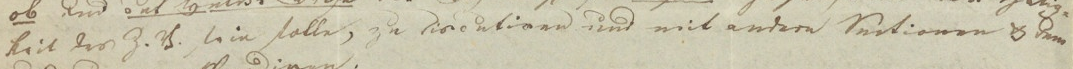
keit des Z.V. sein solle, zu discutiren und mit andern Sectionen & dem
